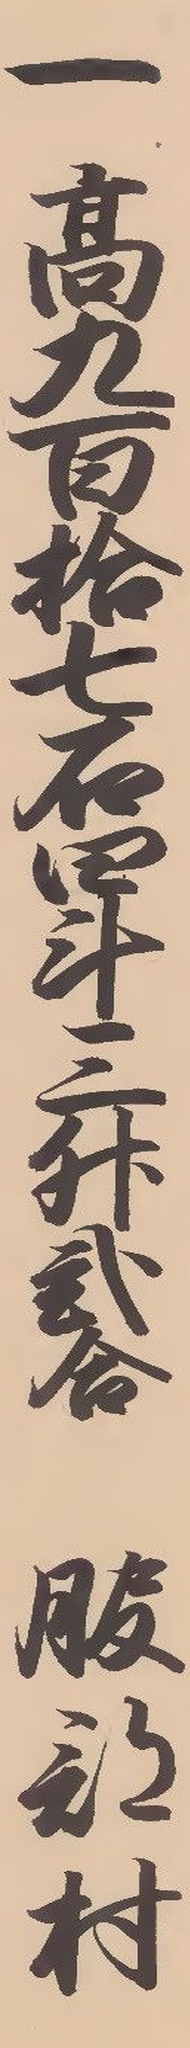一高九百拾七石四斗三升弐合服部村
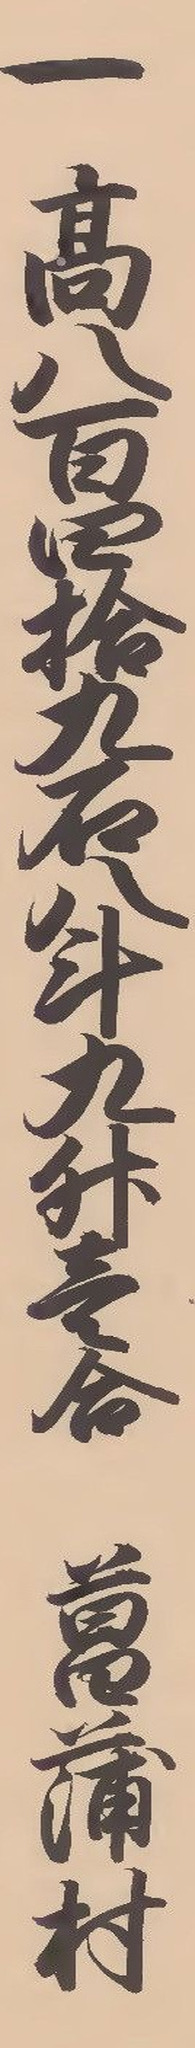一高八百四拾九石八斗九升壱合菖蒲村

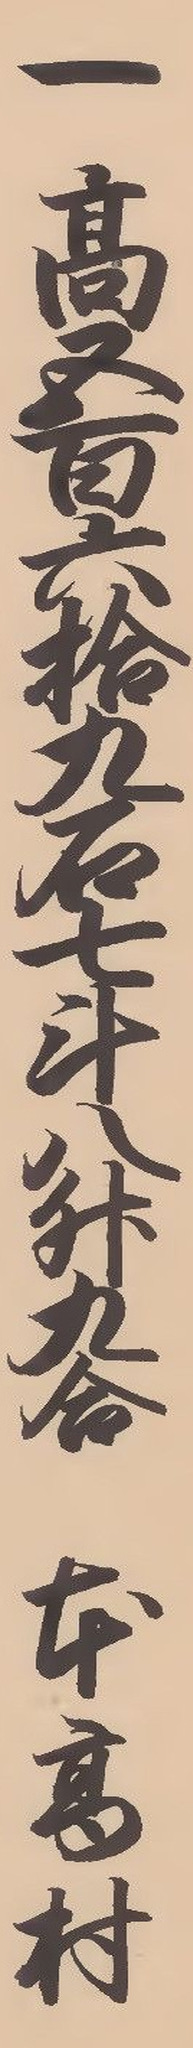一高五百六拾九石七斗八升九合本高村
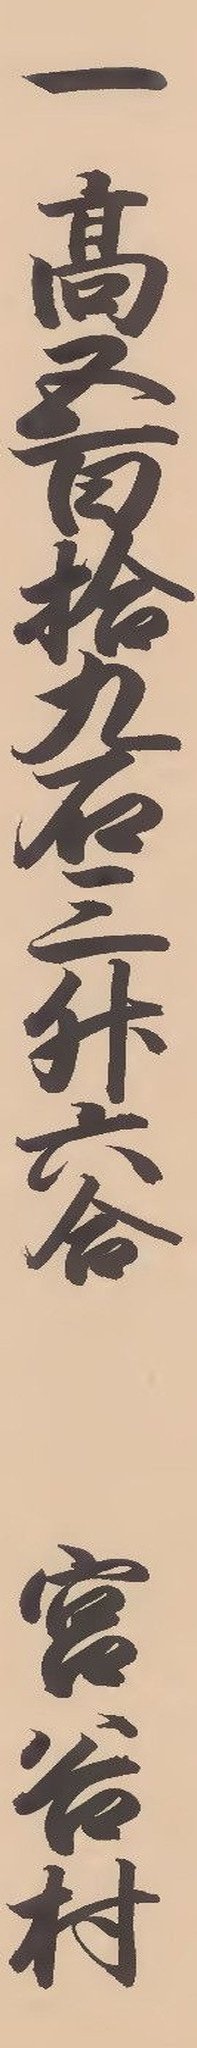一高五百拾九石三升六合宮谷村
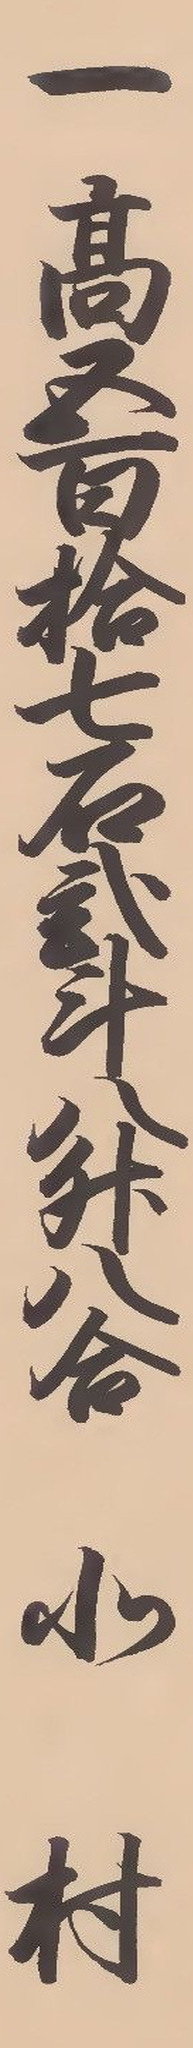一高五百拾七石弐斗八升八合北村
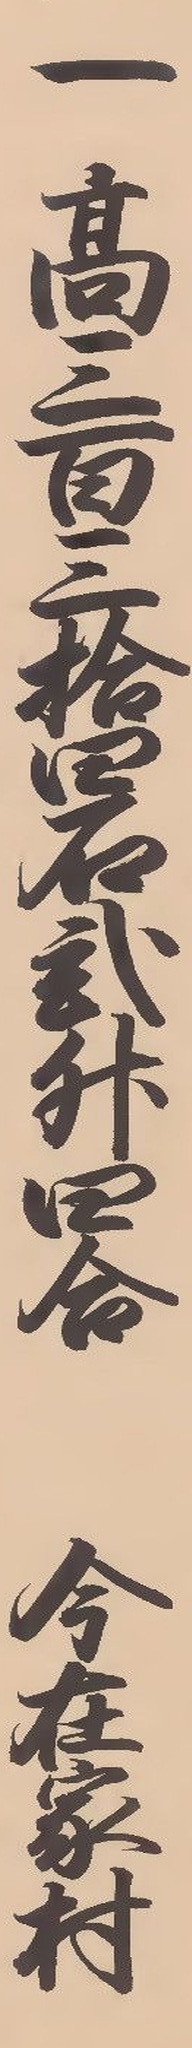一高三百三拾四石弐升四合今在家村
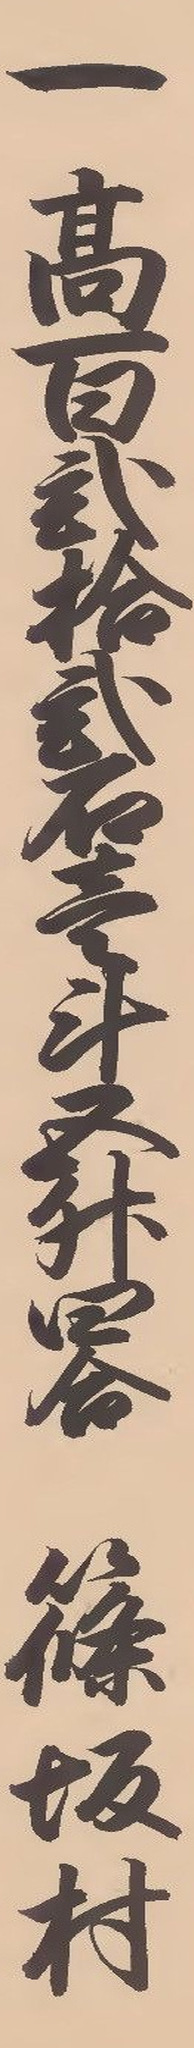一高百弐拾弐石壱斗五升四合篠坂村
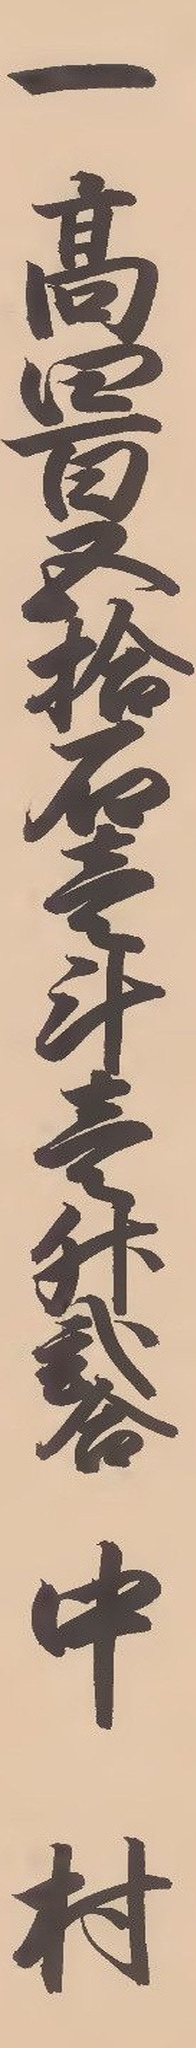一高四百五拾石壱斗壱升弐合中村
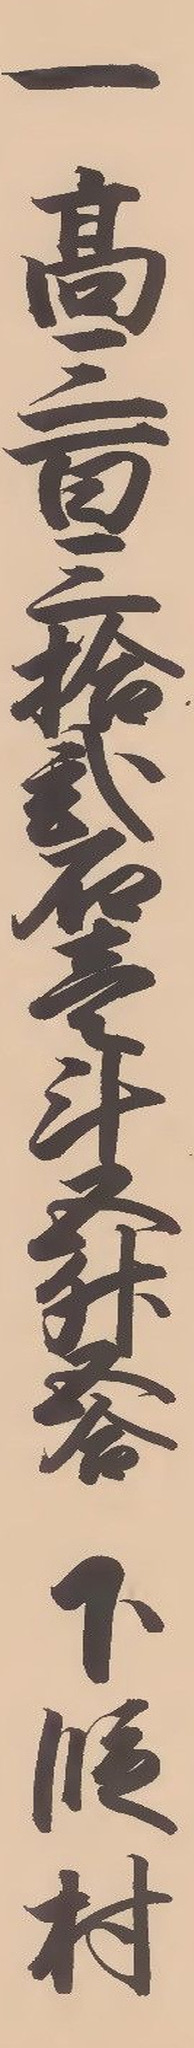一高三百三拾弐石壱斗五升五合下段村
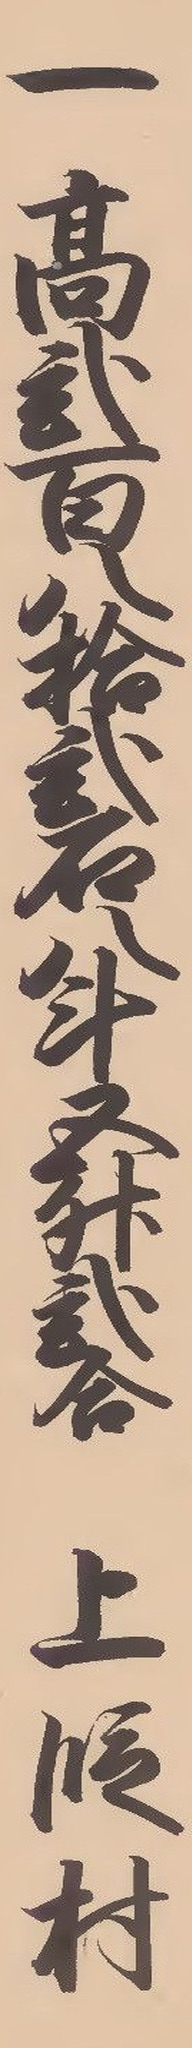一高弐百八拾弐石八斗五升弐合上段村

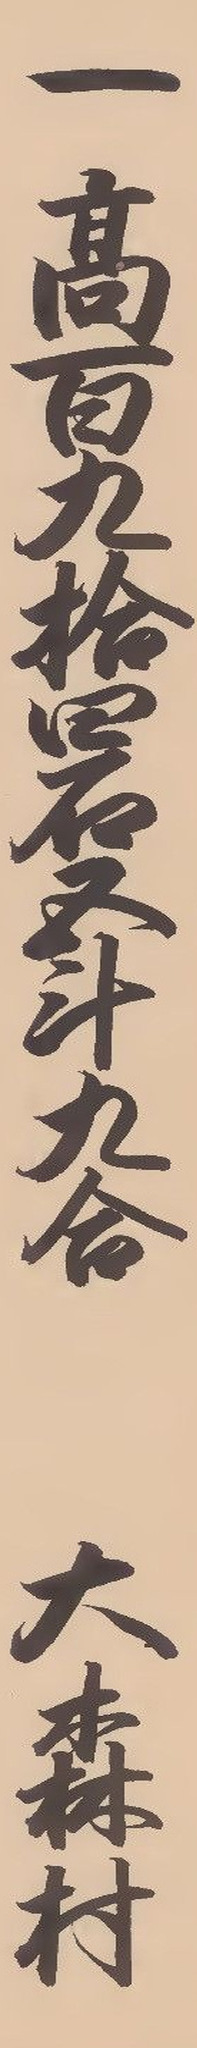一高百九拾四石五斗九合大森村
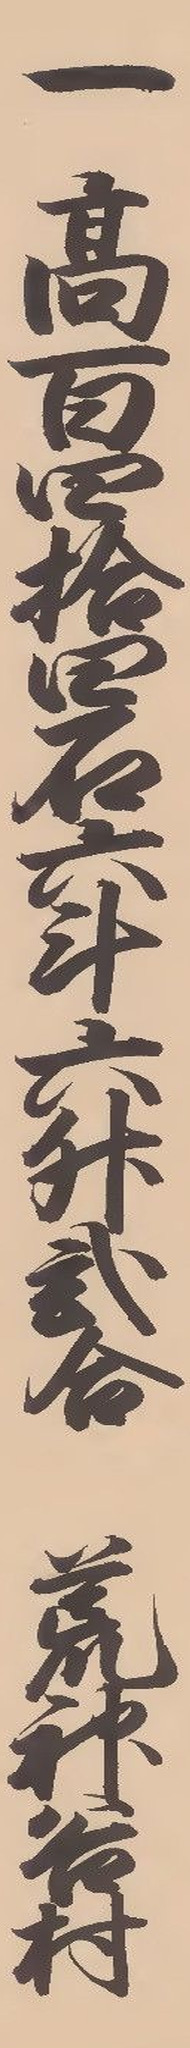一高百四拾四石六斗六升弐合荒神谷村
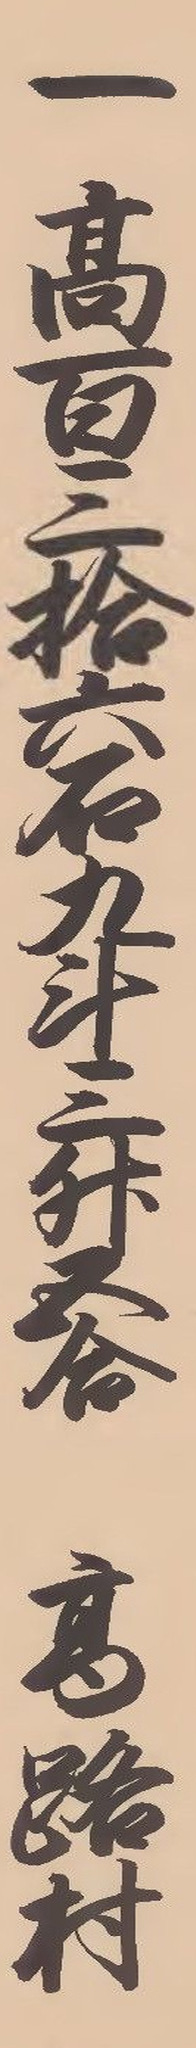一高百三拾六石九斗三升五合高路村
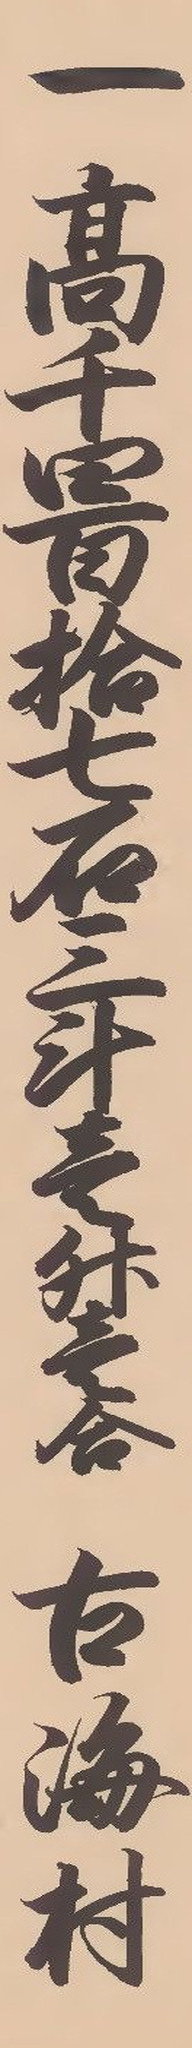一高千四百拾七石三斗壱升壱合古海村
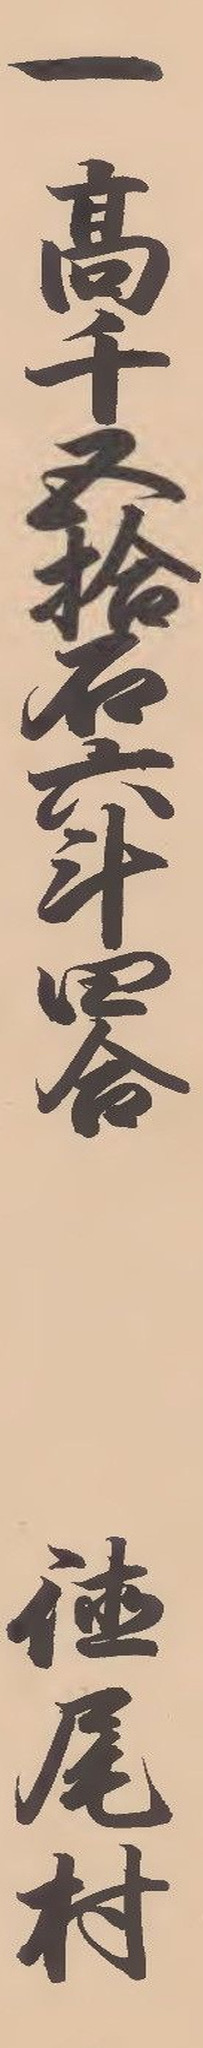一高千五拾石六斗四合徳尾村
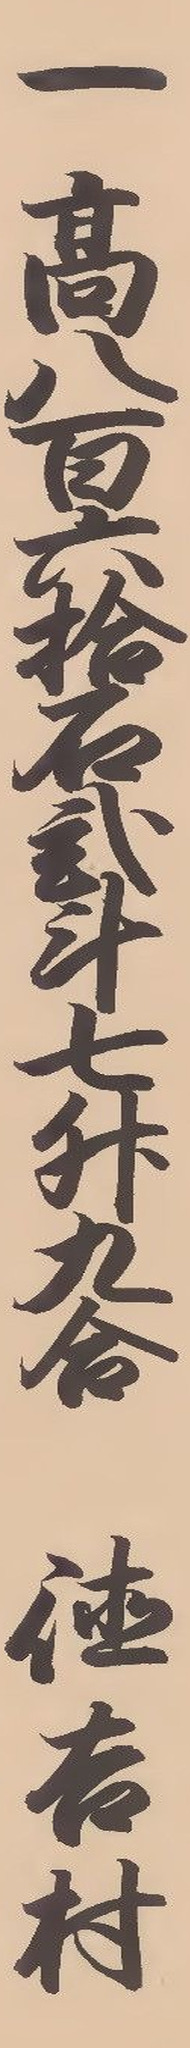一高八百六拾石弐斗七升九合徳吉村
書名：因幡国郷帳
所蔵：国立公文書館 National Archives of Japan
